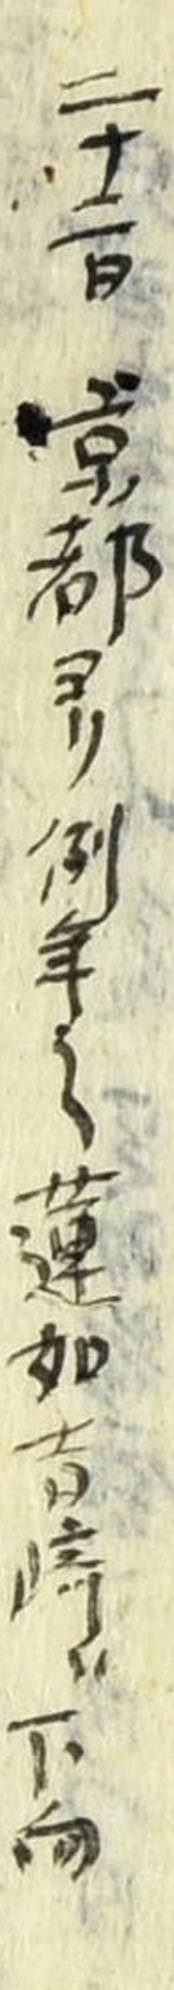二十二日京都ヨリ例年之蓮如吉崎江下向
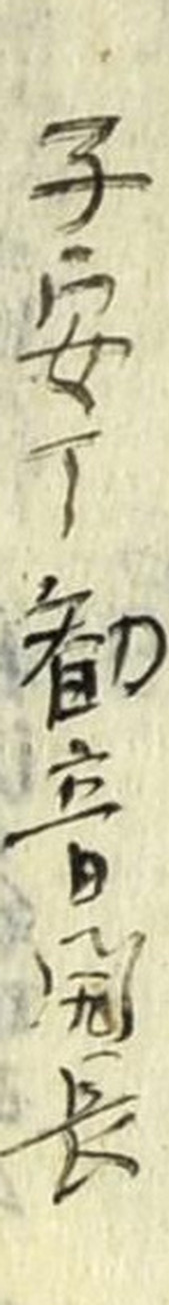子安丁勧音開長
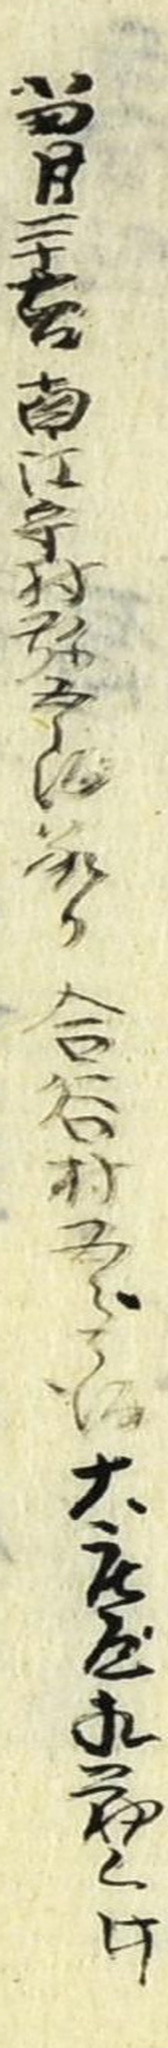当月二十七日南江守村弥五兵衛承リ合谷村五郎兵衛大庄屋相勤候此
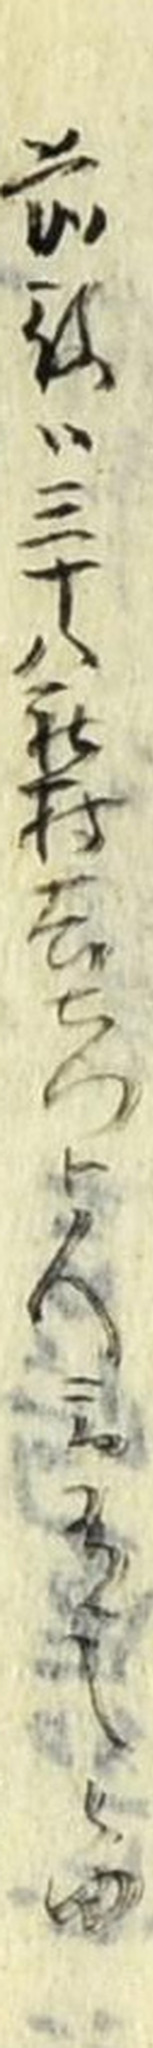前役ハ三十八社村吉右衛門ト人ニ而有之候由
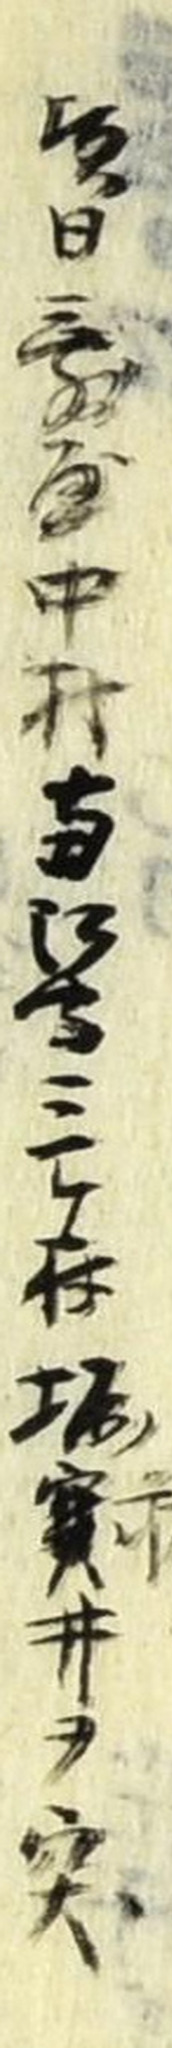頃日舞屋中村南江守三ヶ村堀抜井ヲ突

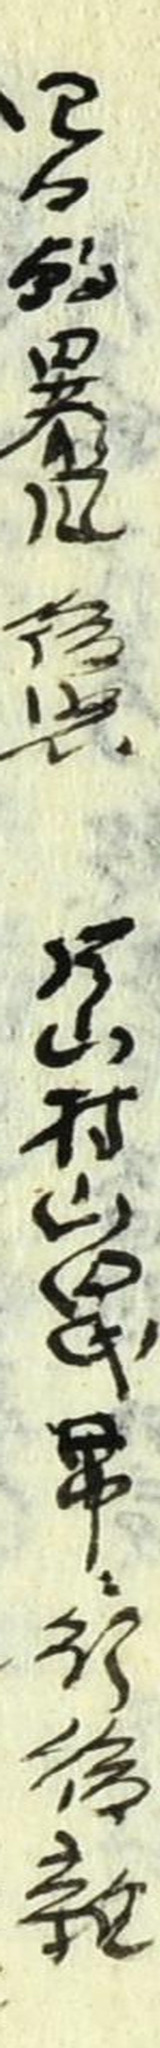四日朝暴風後照片山村山田氏日中ニ行後雑
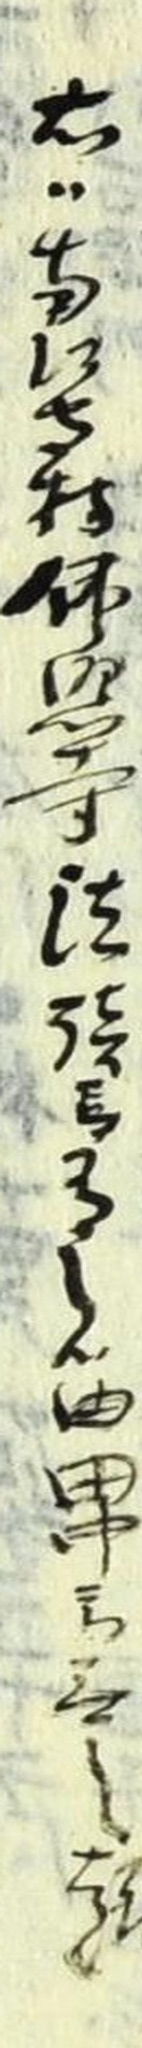右ハ南江守村仏照寺法談ニ而有之候由田中ニ而無之趣
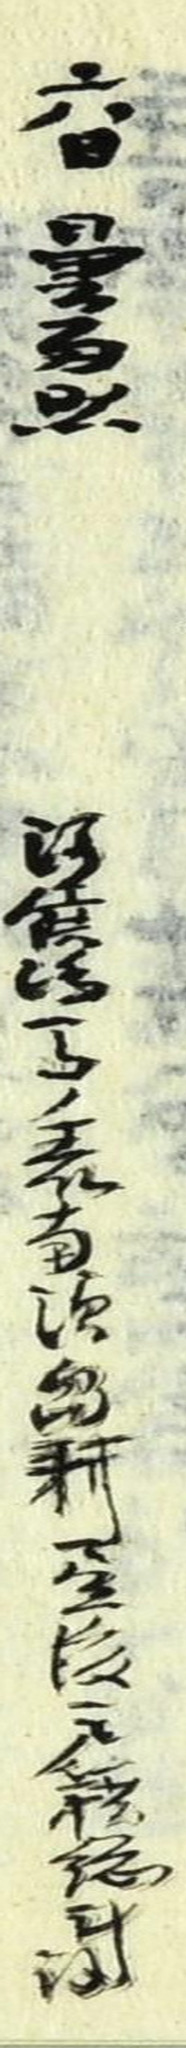六日曇雨照河饒島馬ノ表南浜畠耕昼後戸籍総計調
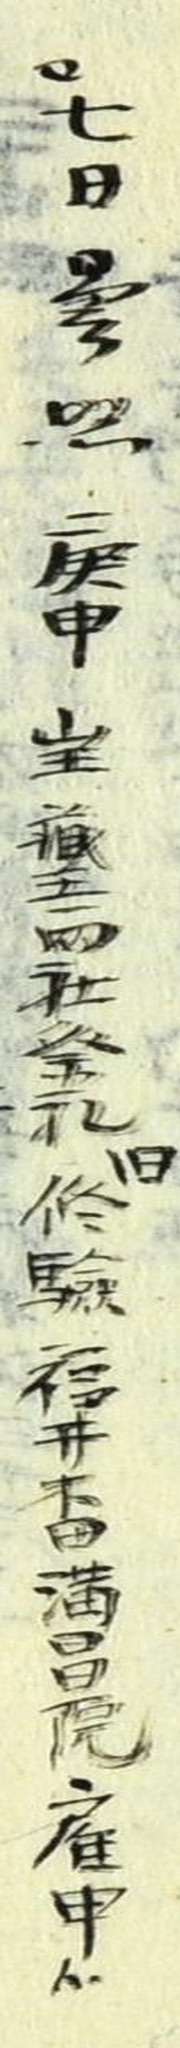○七日曇照庚申山王蔵王両社祭礼旧修験福井木田満昌院雇申候
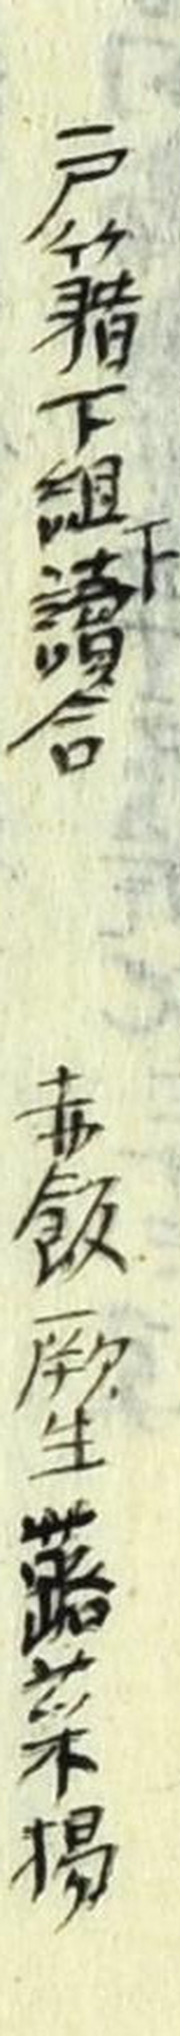戸籍下組下読合赤飯蕨生蕗菜揚
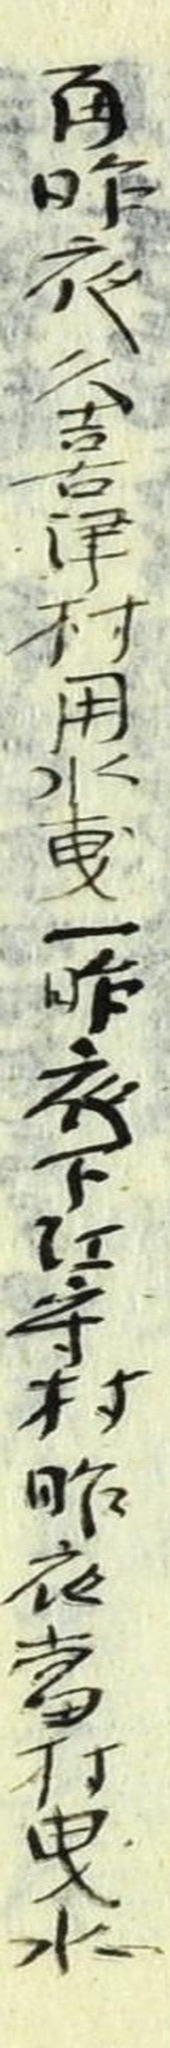再昨夜久喜津村用水曳一昨夜下江守村昨夜当村曳水
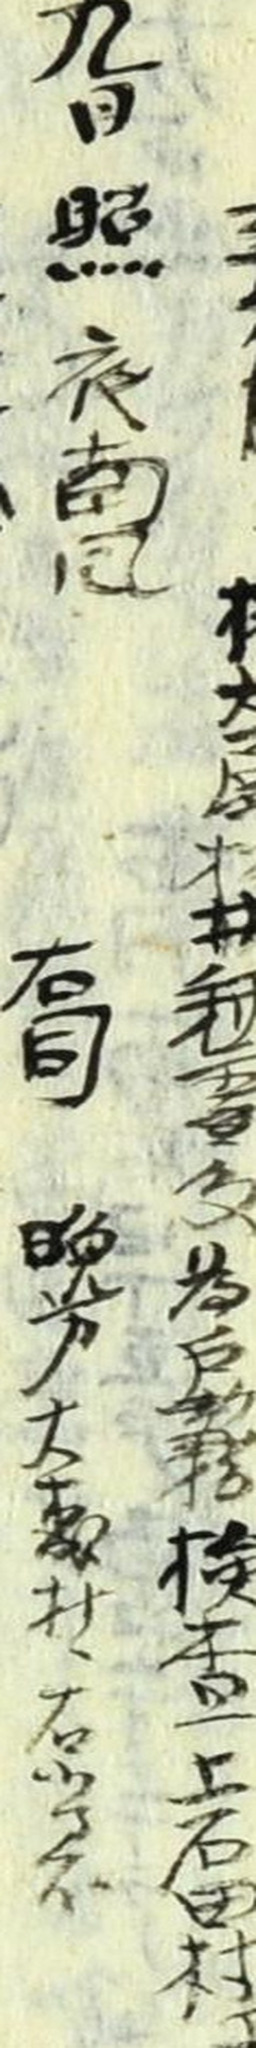九日照夜南風右同晩方大森村へ右御着
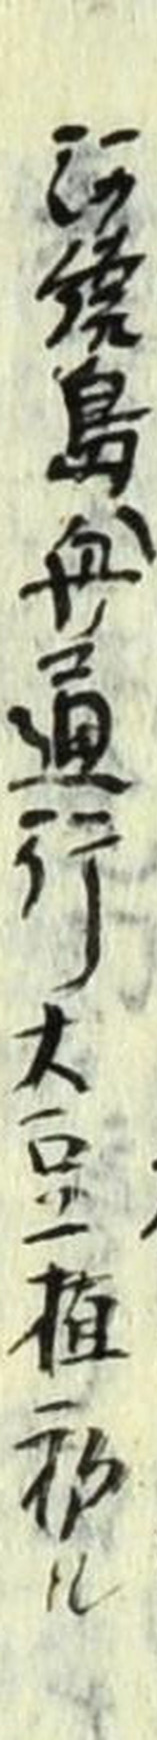河饒島へ舟通行大豆植初ル
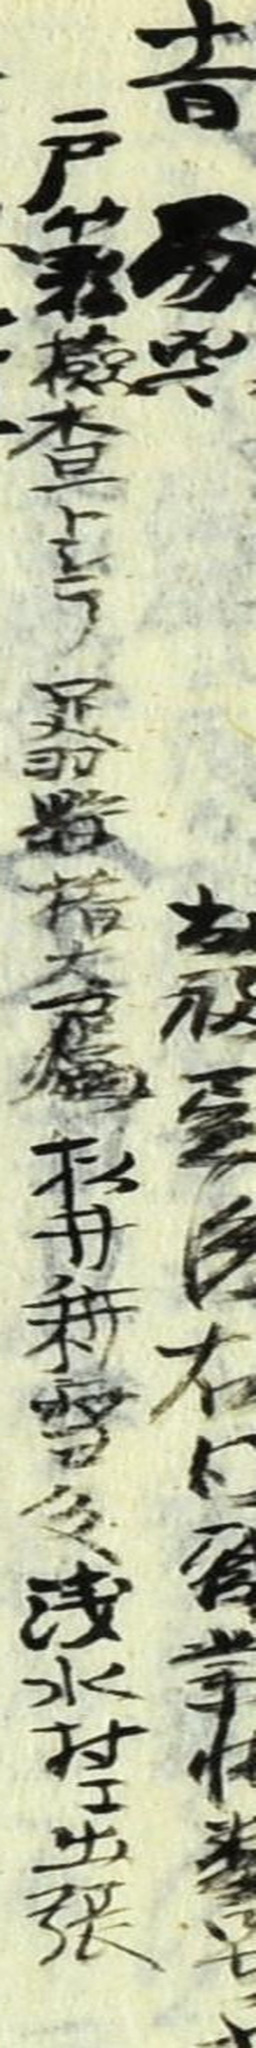戸籍検査トシテ足羽県権大属松井耕雪殿浅水村エ出張
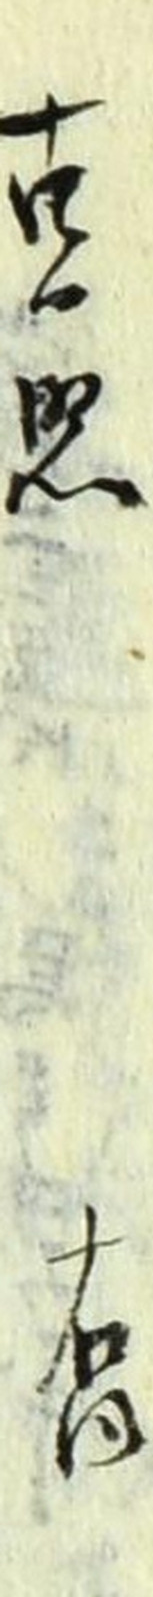十四日照右同
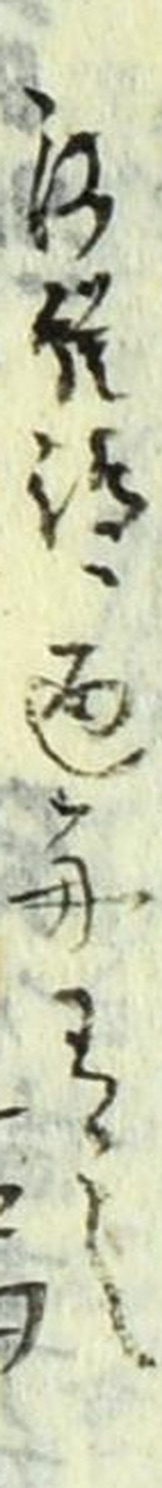河饒島へ通舟有之
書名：（日記）
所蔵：福井県文書館 Fukui Prefectural Archives
